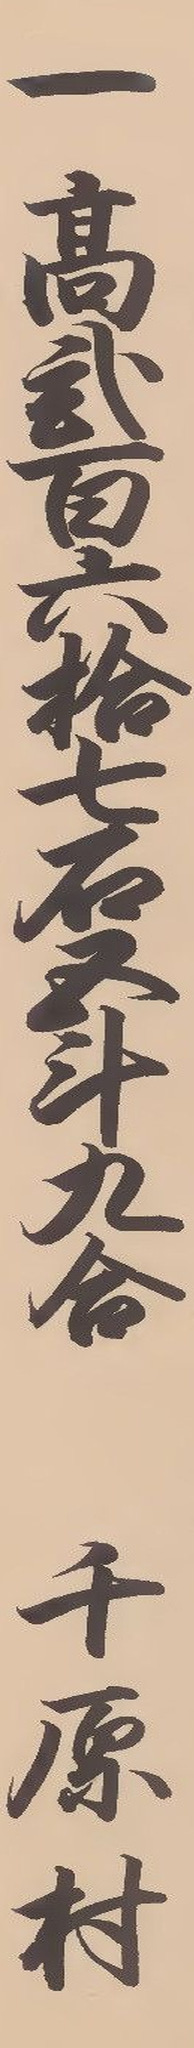一高弐百六拾七石五斗九合千原村
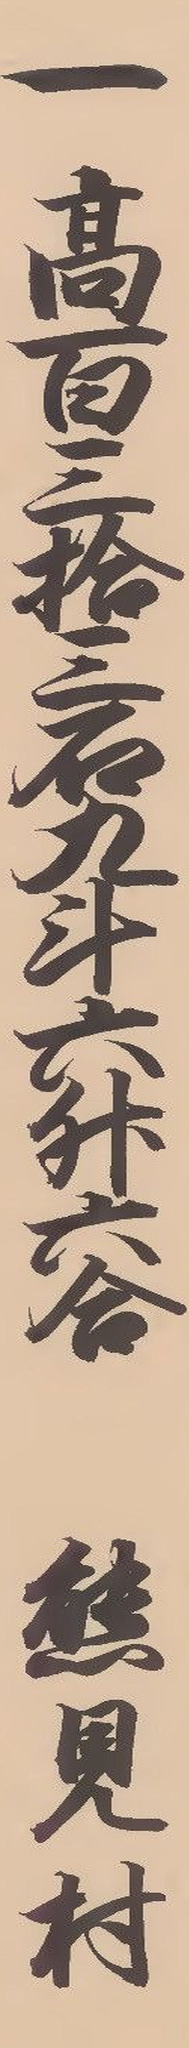一高百三拾三石九斗六升六合熊見村
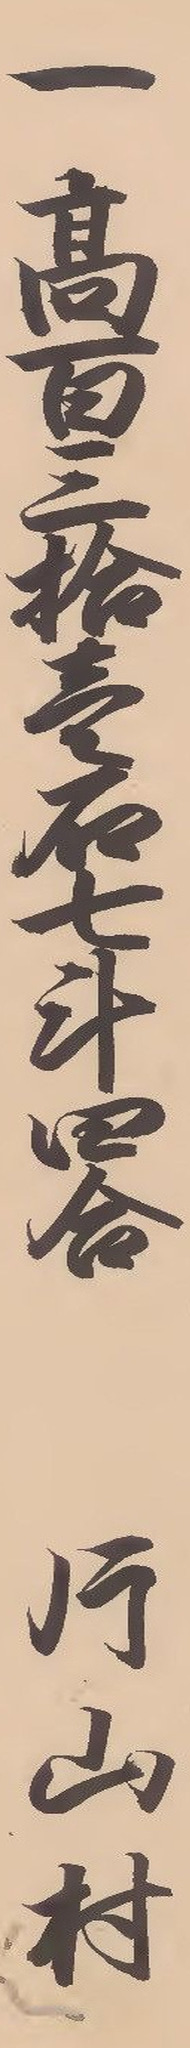一高百三拾壱石七斗四合片山村

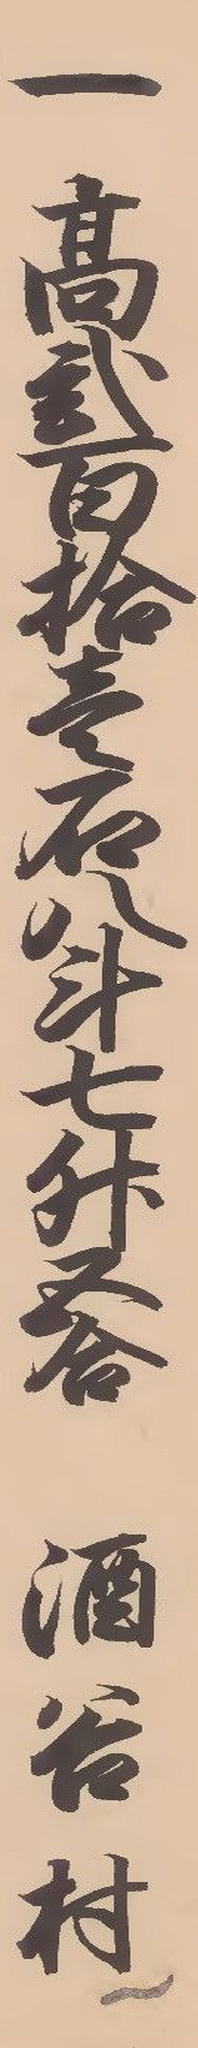一髙弐百拾壱石八斗七升五合酒谷村
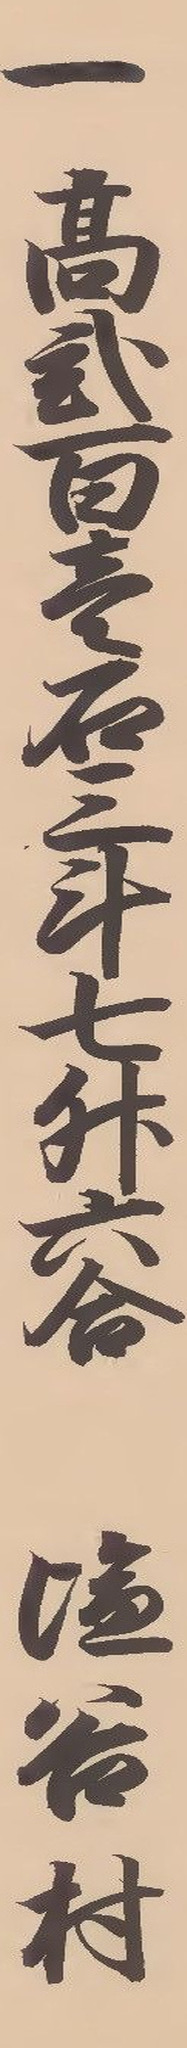一髙弐百壱石三斗七升六合塩谷村
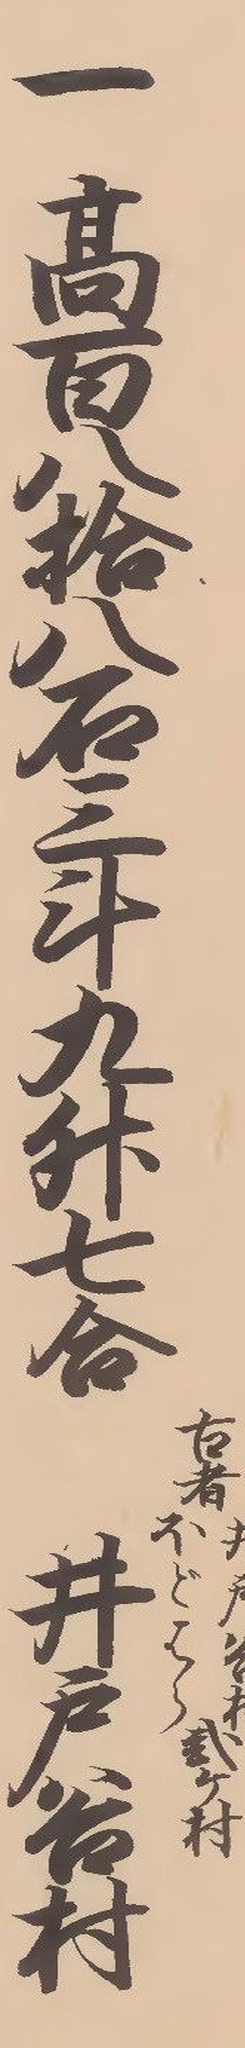一髙百八拾八石三斗九升七合井土谷村
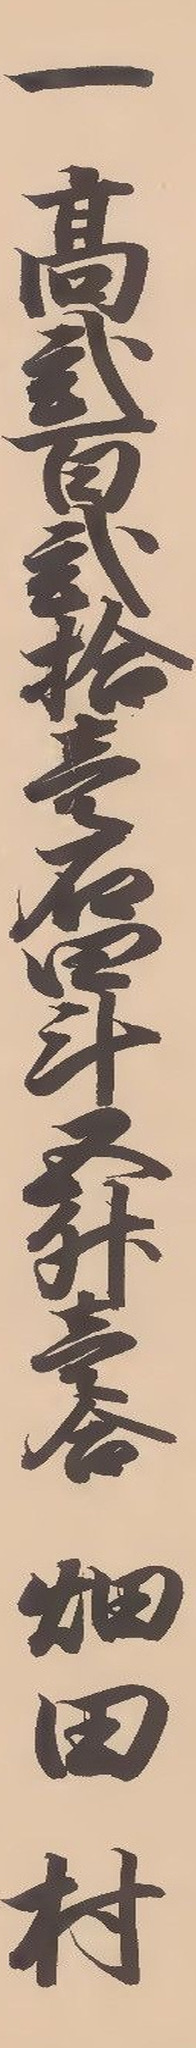一髙弐百弐拾壱石四斗五升壱合畑田村
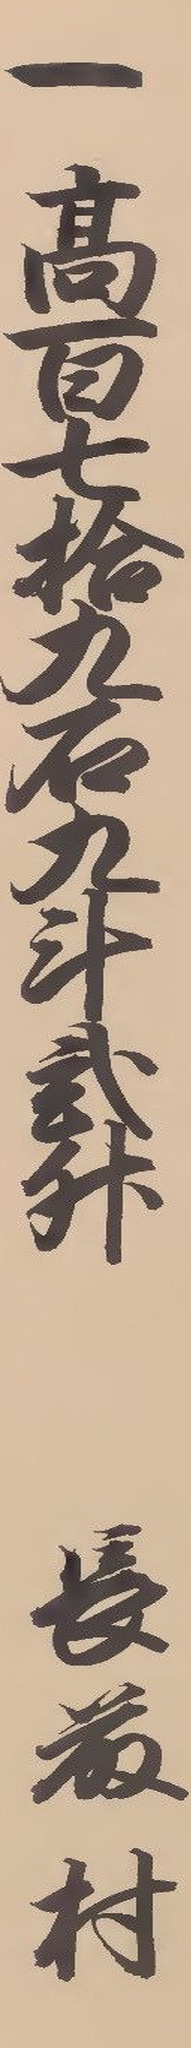一髙百七拾九石九斗弐升長藤村
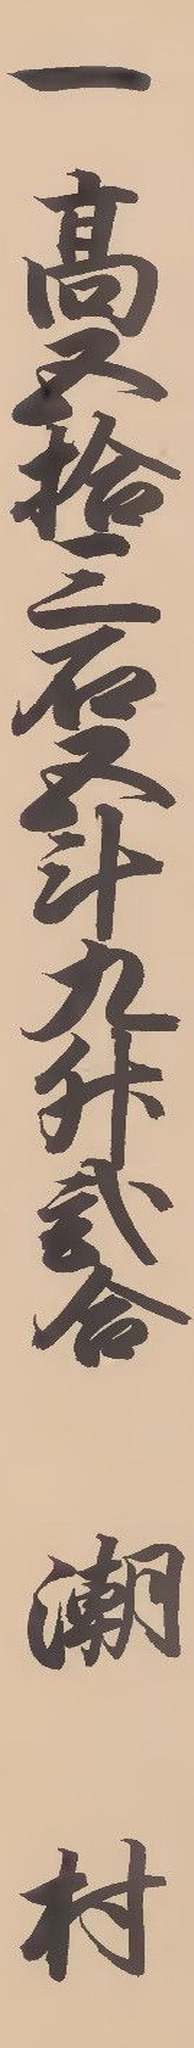一髙五拾三石五斗九升弐合潮村
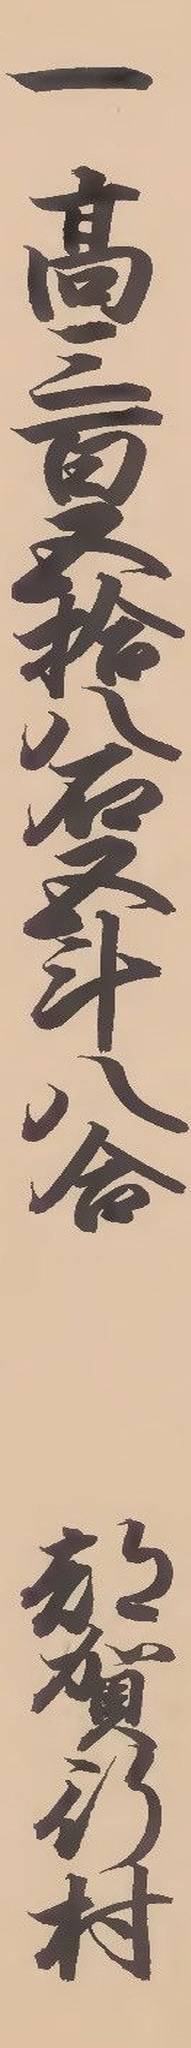一髙三百五拾八石五斗八合都賀行村
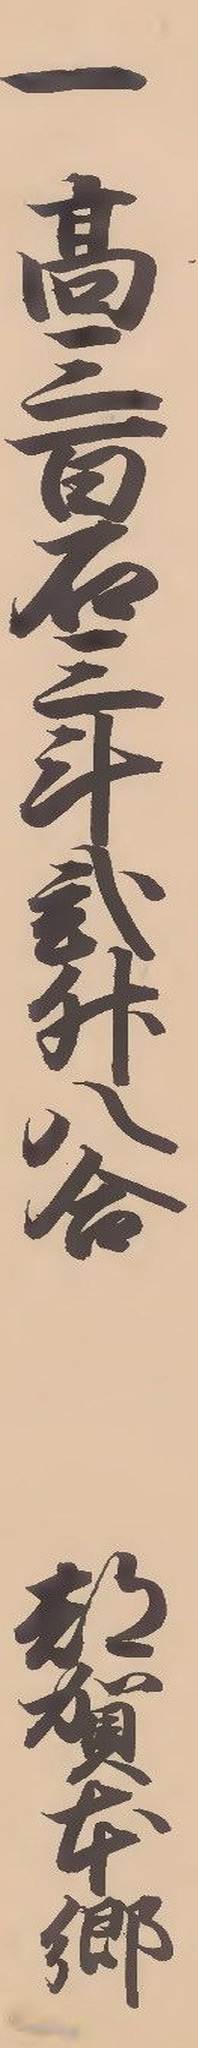一髙三百石三斗弐升八合都賀本郷

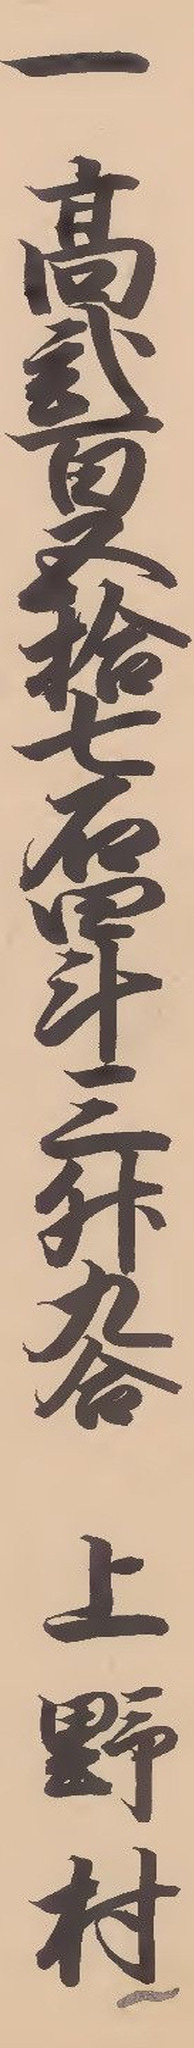一髙弐百五拾七石四斗三升九合上野村
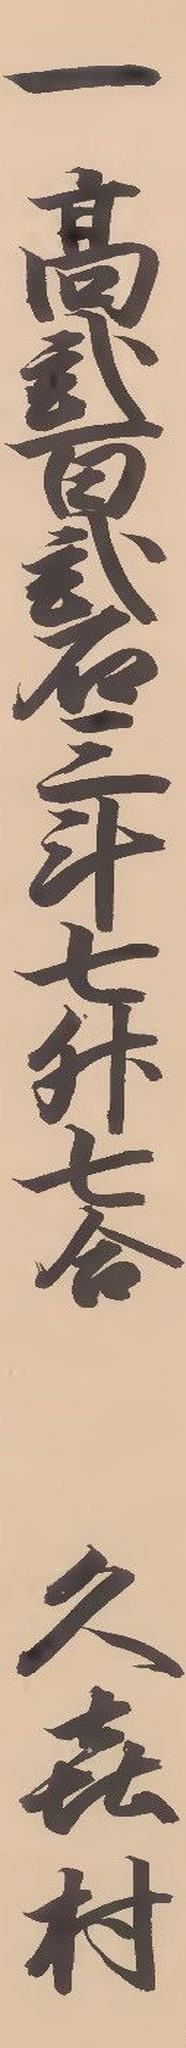一髙弐百弐石三斗七升七合久喜村
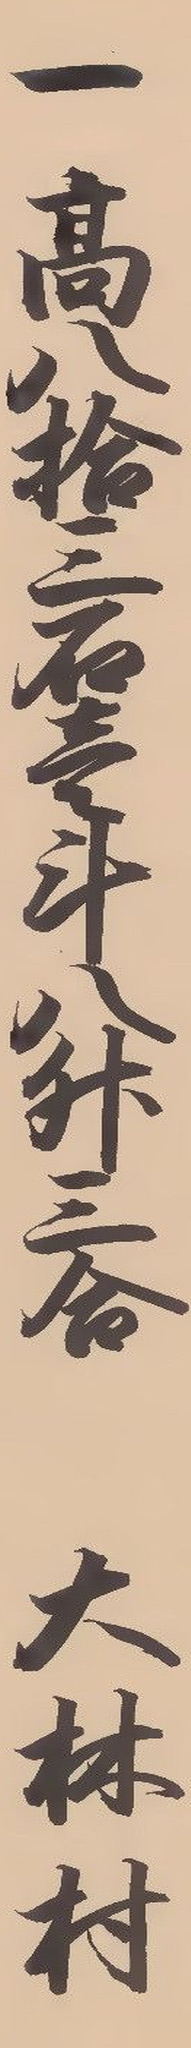一髙八拾三石壱斗八升三合大林村
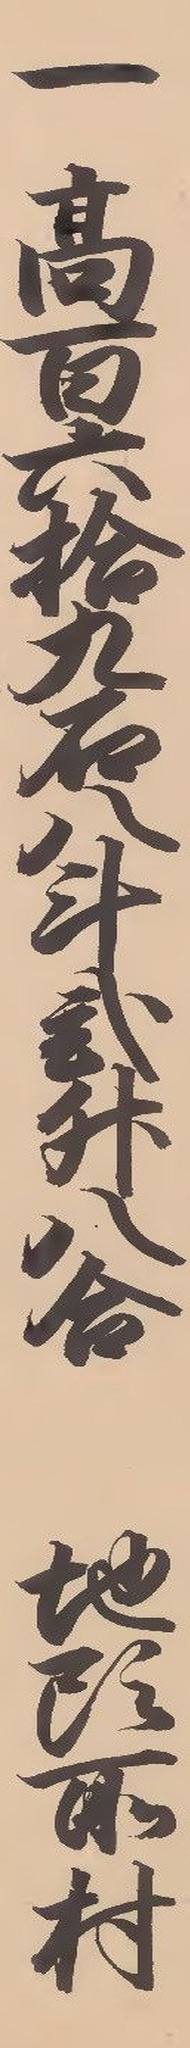一髙百六拾九石八斗弐升八合地頭所村
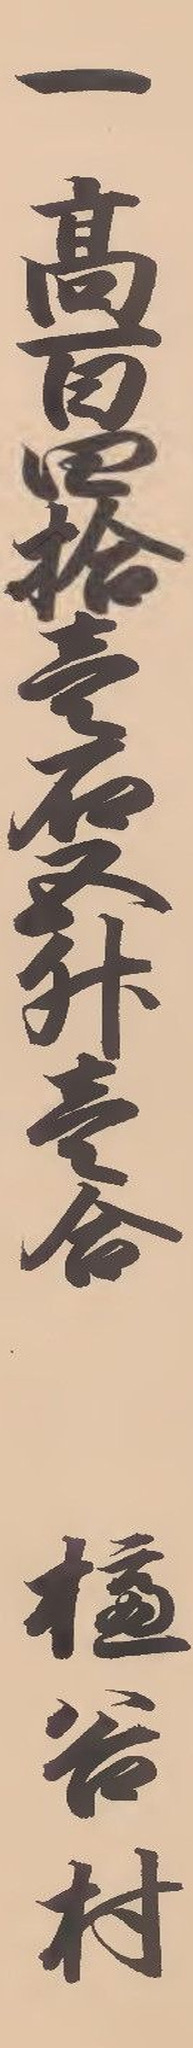一髙百四拾壱石五升壱合櫨谷村
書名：石見国郷帳
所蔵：国立公文書館 National Archives of Japan
